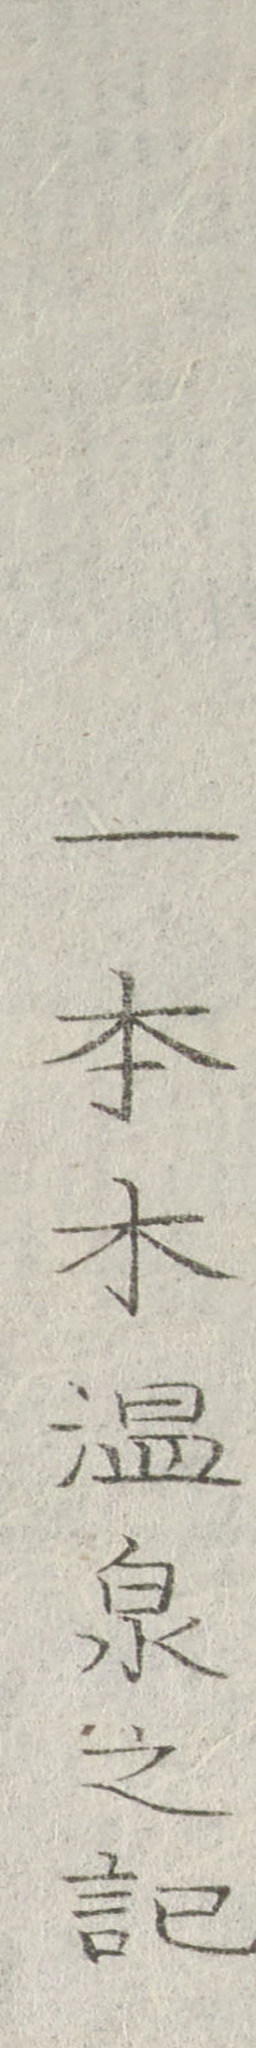一本木温泉之記
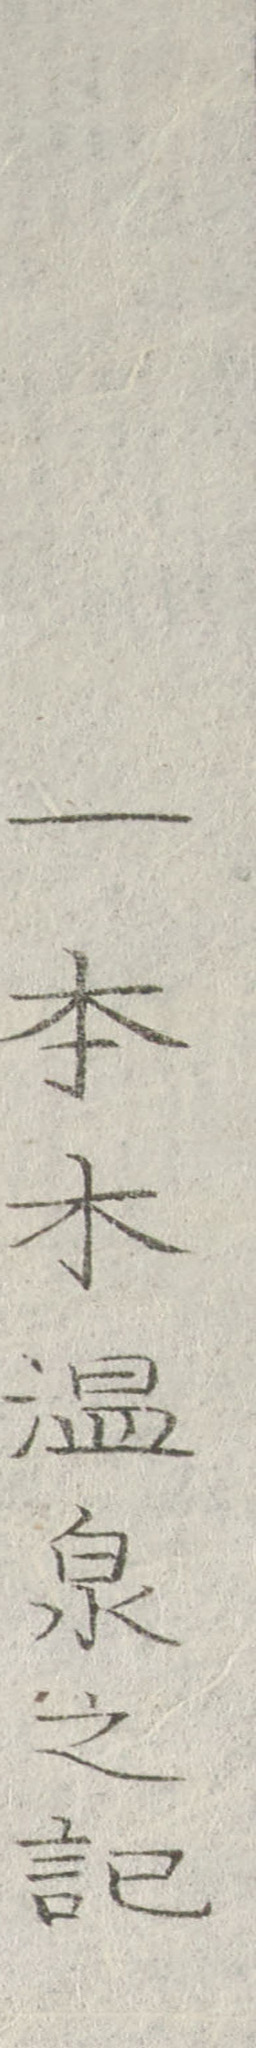一本木温泉之記
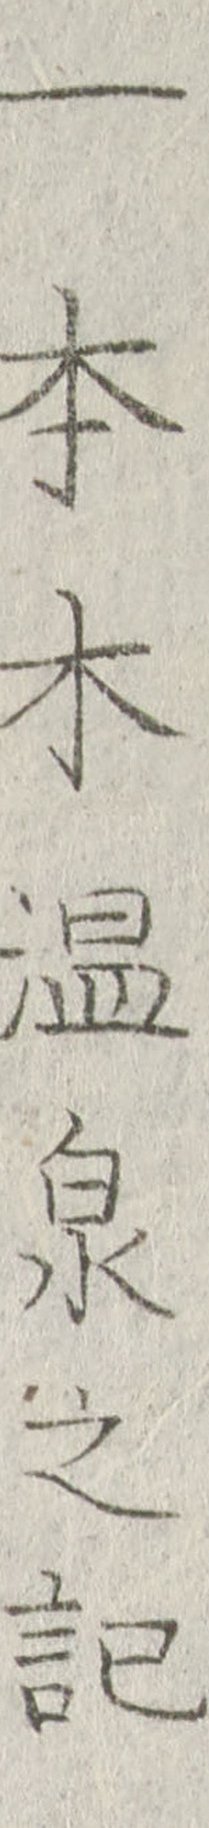一本木温泉之記
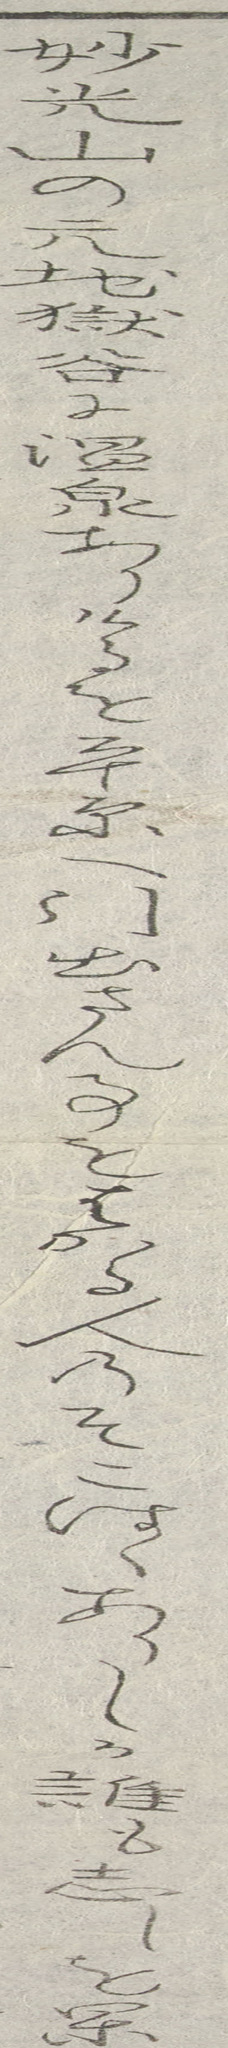妙光山の元地獄谷に温泉ありけるを平原へ引出さん事をはかる人のそこはくありしか誰も志しを果さすして
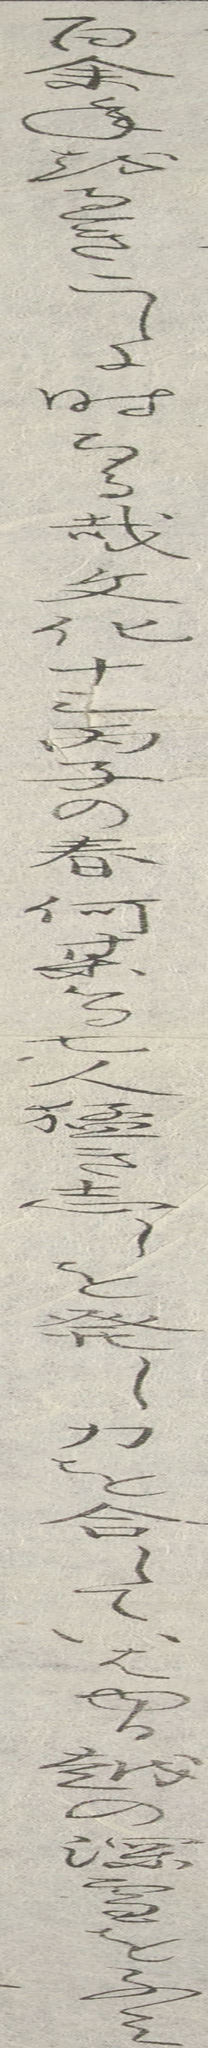百余年を過きこしに時なる哉文化十三丙子の春何某等七人猛き志しを発し力を合していはゆる越の深雪をふみ
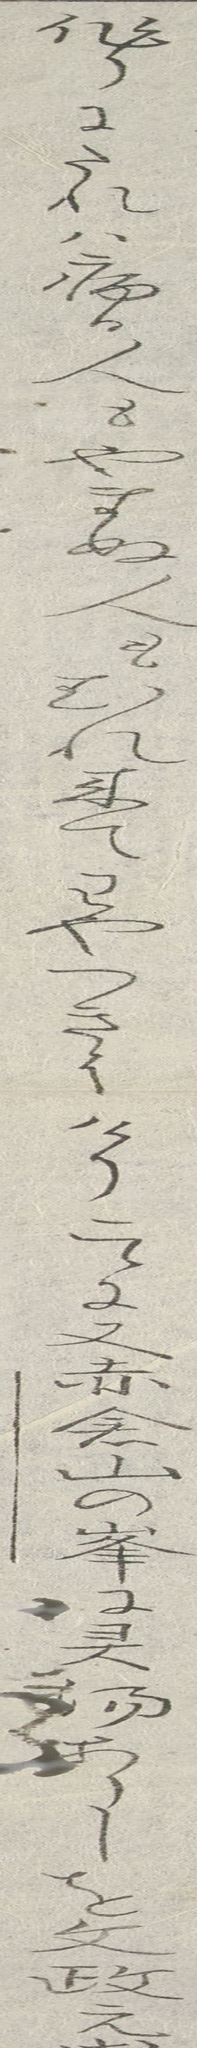作りにたれは病る人もやまぬ人もむれ来てはやつきにけりこゝに又赤倉山の峯に霊湯ありしを文政元戊寅年
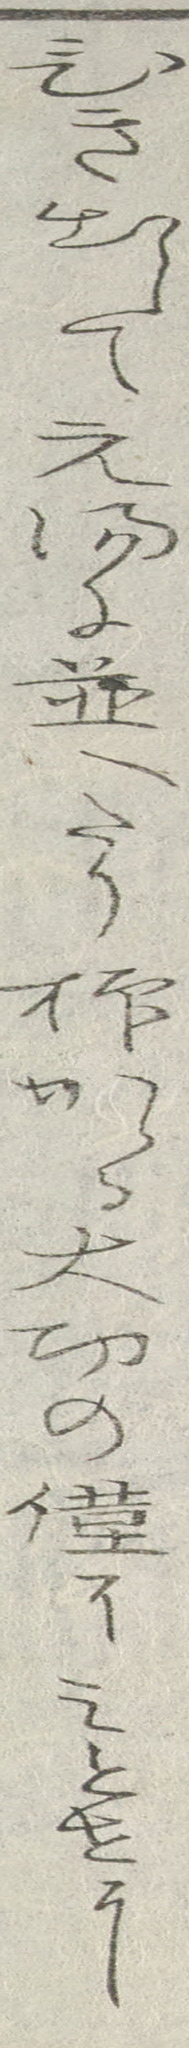ひき出して元湯に並へたり抑かゝる大功の僅にみとせに
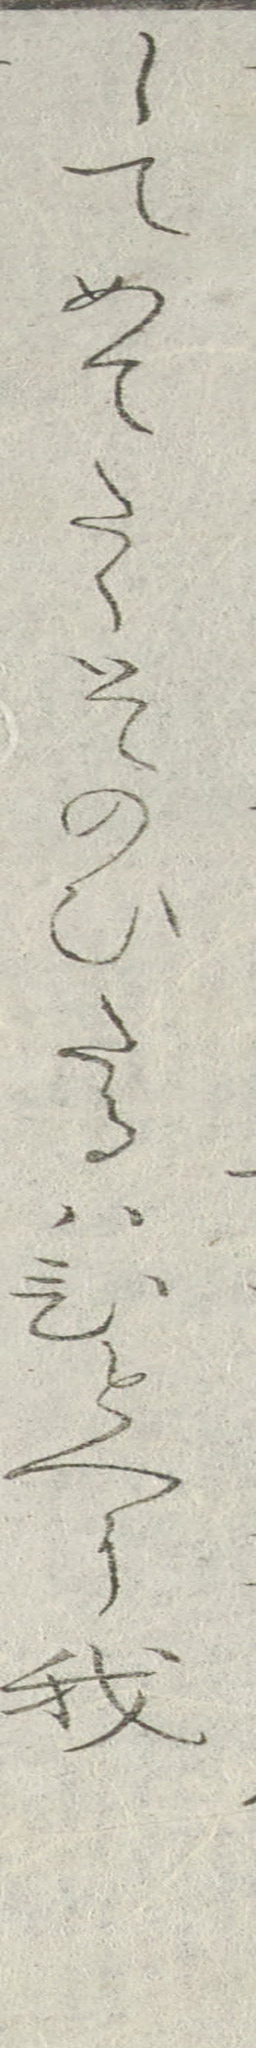してめてたくそのいたるはひとつに我
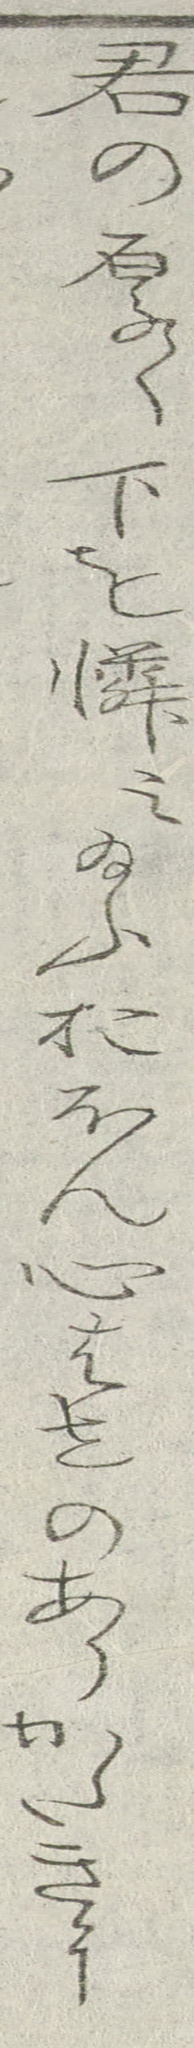君の厚く下を憐み給ふおほん心はしのありかたきに
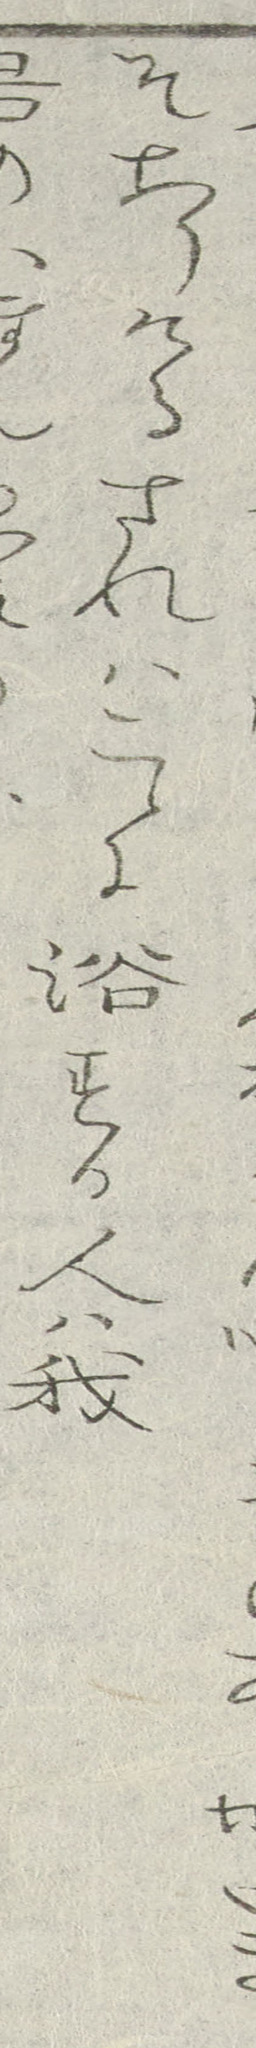そありけるされはこゝに浴する人は我
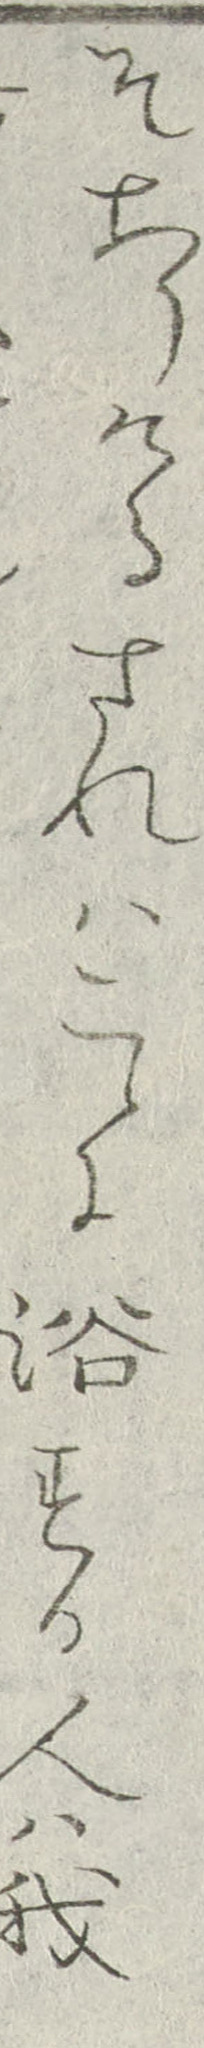そありけるされはこゝに浴する人は我
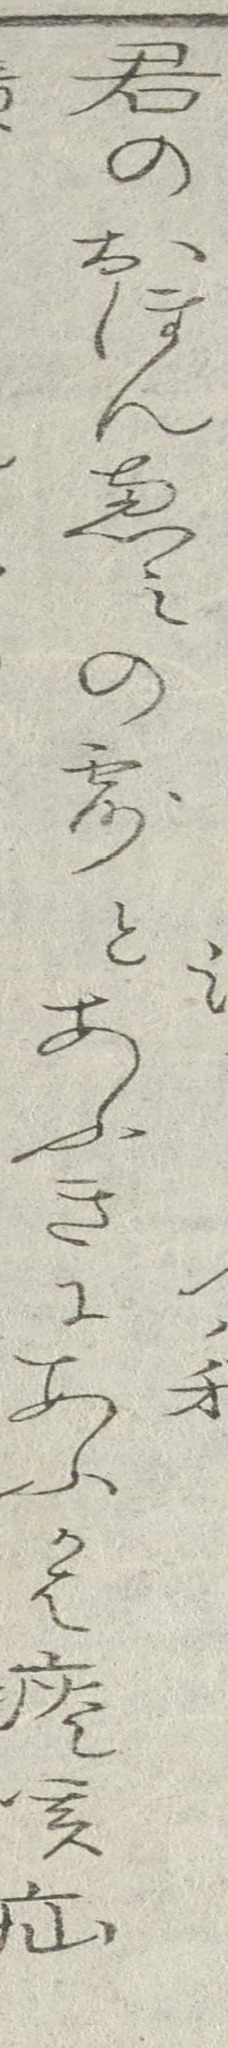君のおほん恵みの露とあふきにあふかは痰咳疝
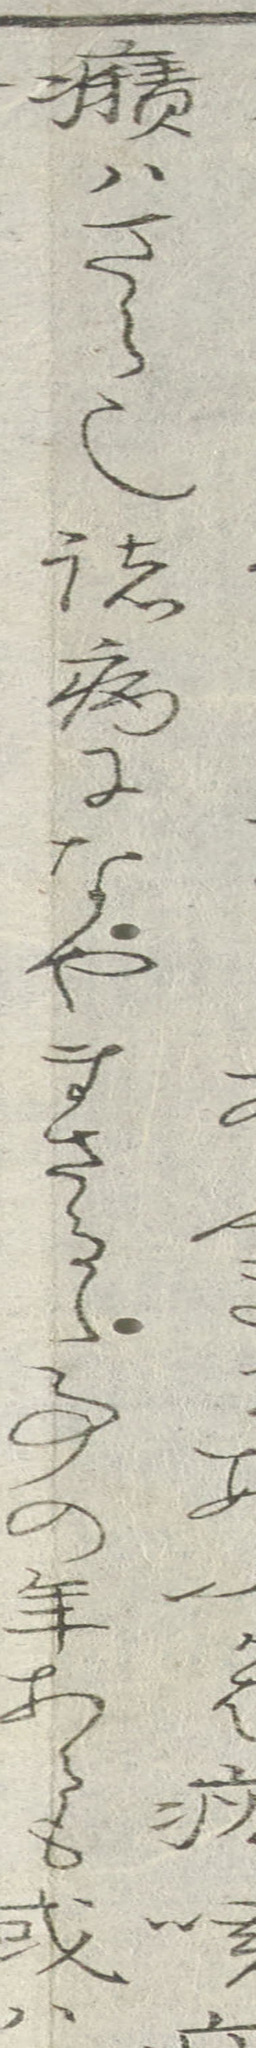癪はさらに諸病になやまさるゝ事の年あるも或は
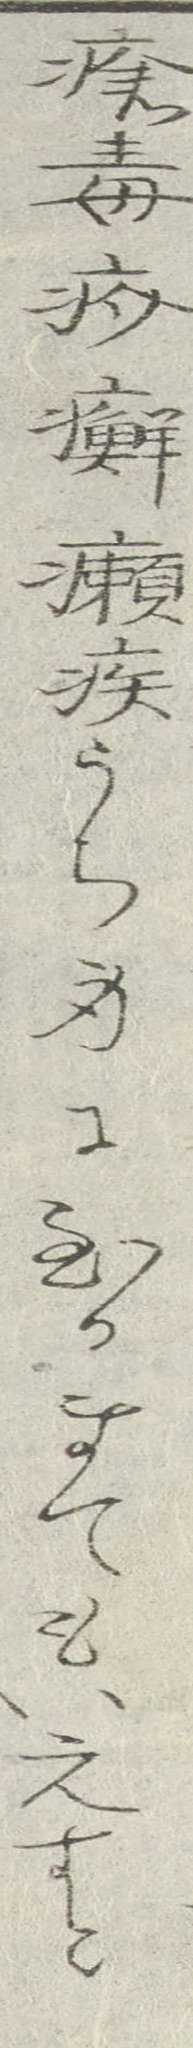瘡毒疥癬癩疾うち身に至るまてもいえすと
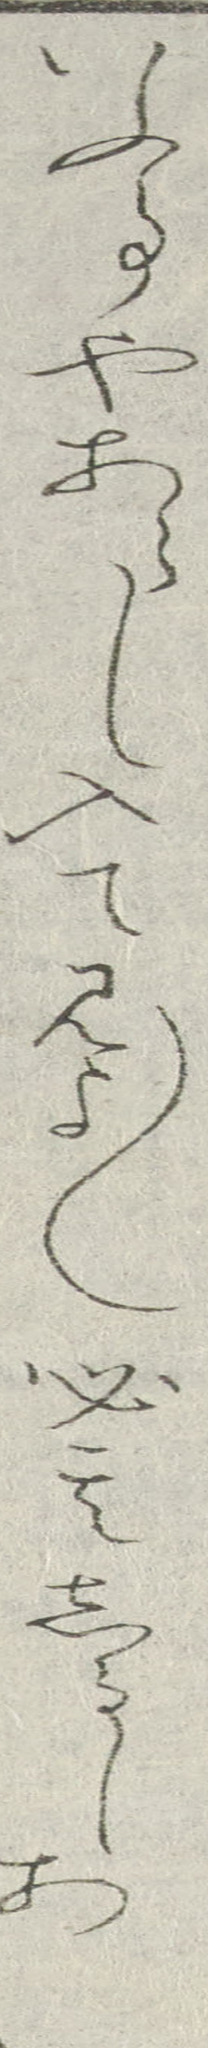いふ事やあらし入てみよ〳〵必其しるしお
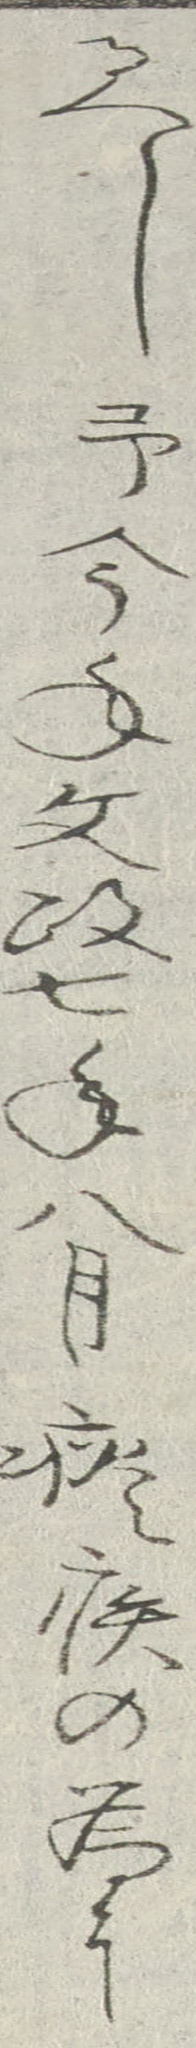見し予今年文政七年八月痰疾の為に
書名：一本木温泉之記
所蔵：東京大学総合図書館 General Library in the University of Tokyo, JAPAN
